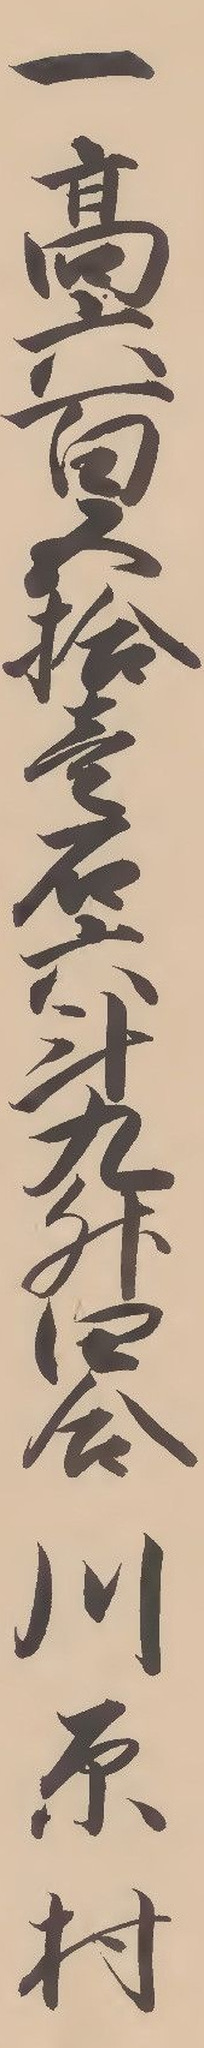一高六百五拾壱石六斗九升四合川原村
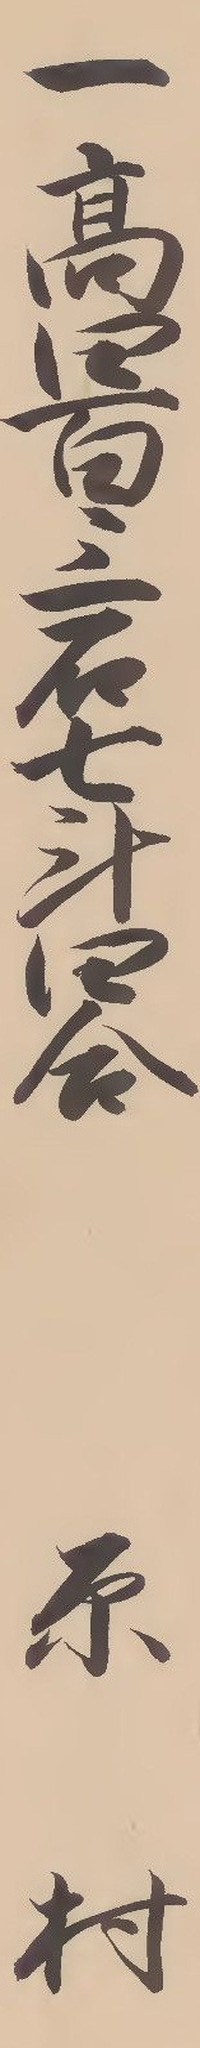一高四百三石七斗四合原村
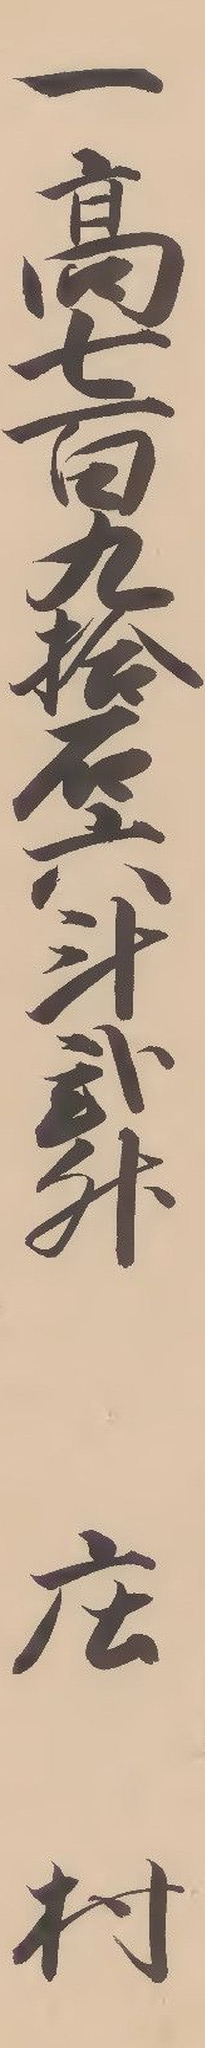一高七百九拾石六斗弐升庄村

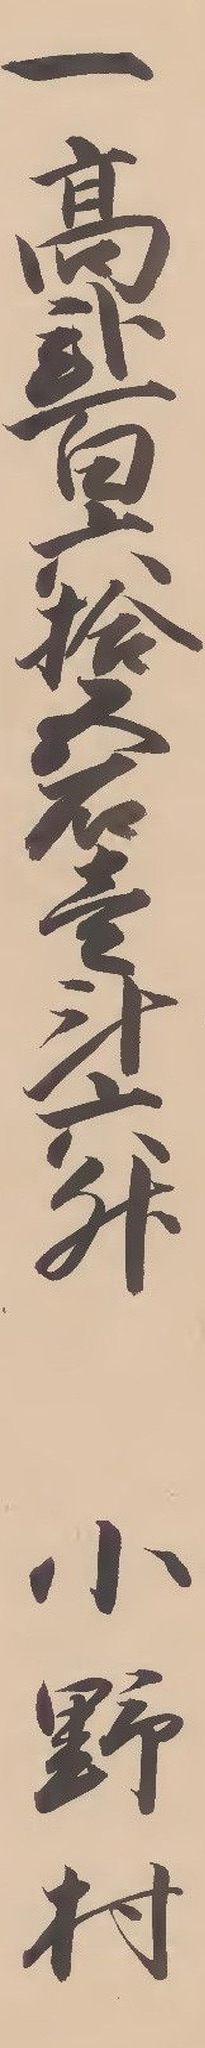一高弐百六拾五石壱斗六升小野村
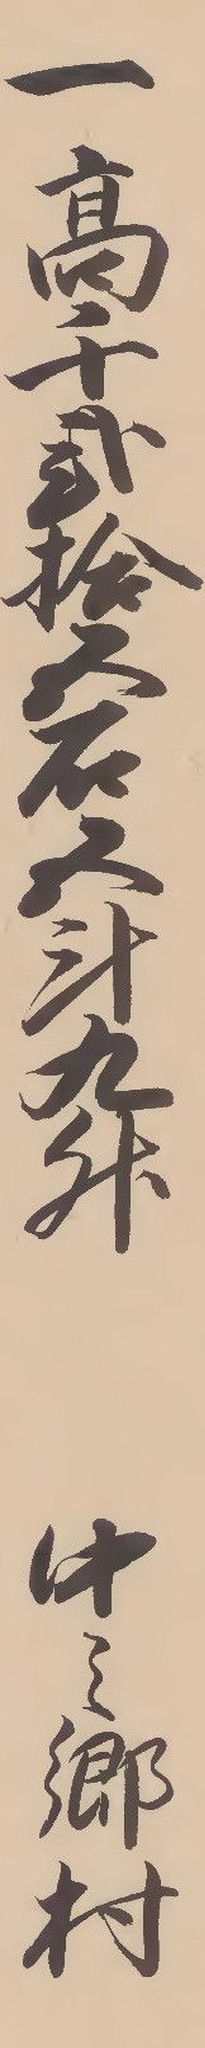一高千弐拾五石五斗九升中之郷村
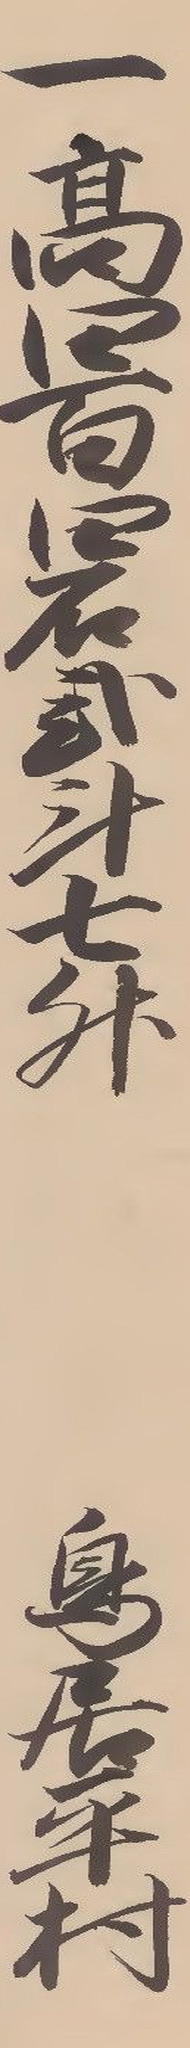一高四百四石弐斗七升鳥居平村
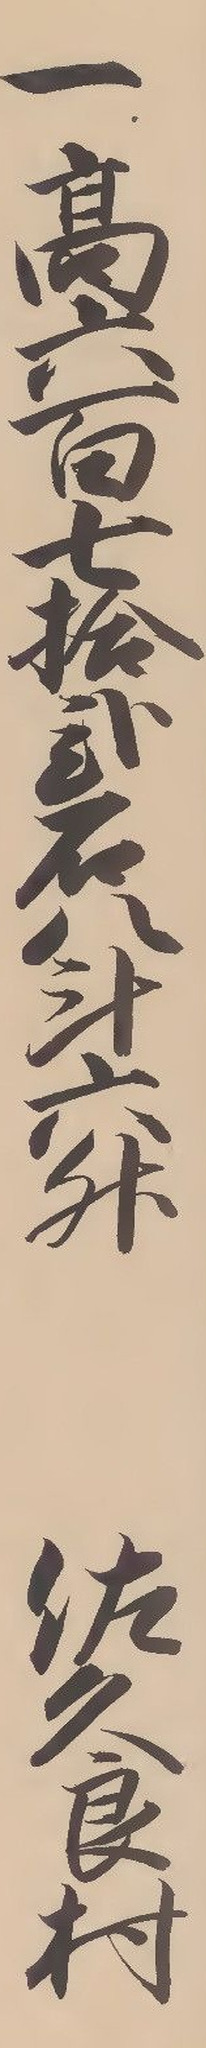一高六百七拾弐石八斗六升佐久良村
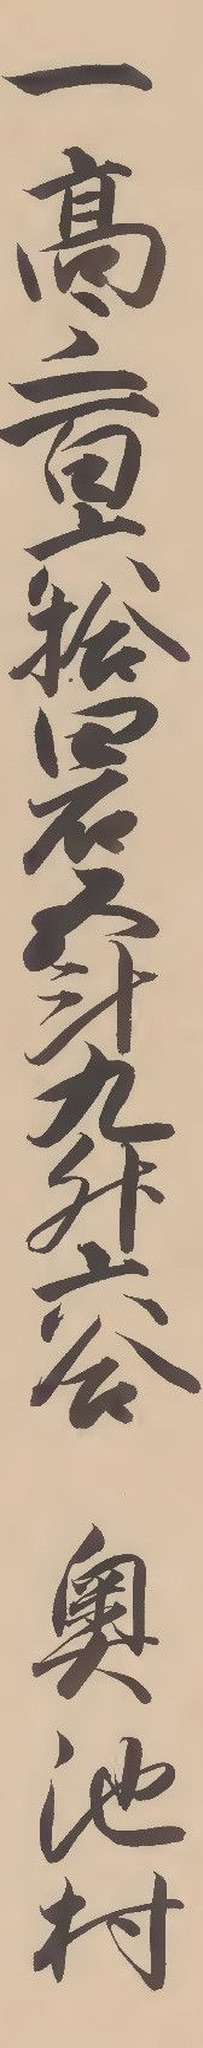一高三百六拾四石五斗九升六合奥池村
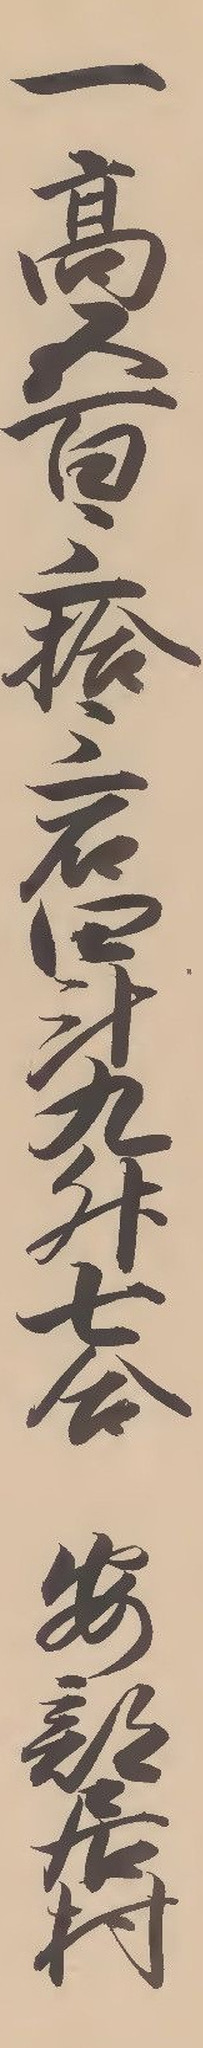一高五百三拾三石四斗九升七合安部居村
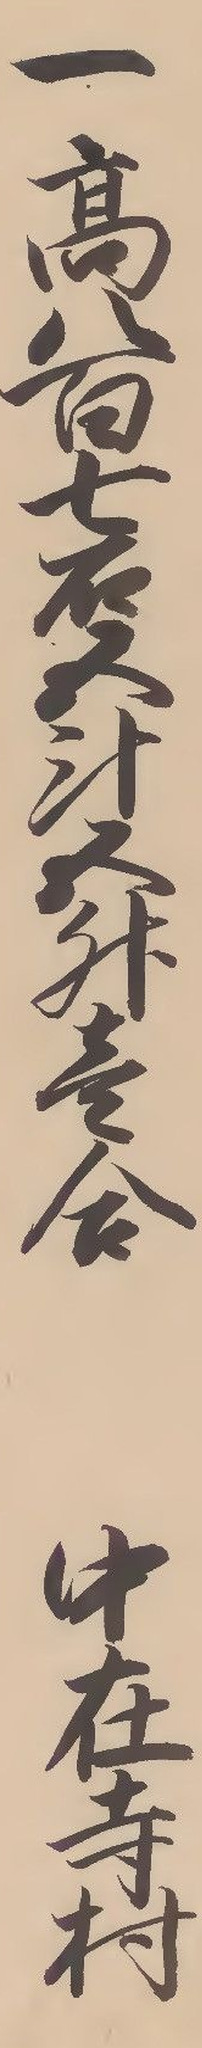一高八百七石五斗五升壱合中在寺村

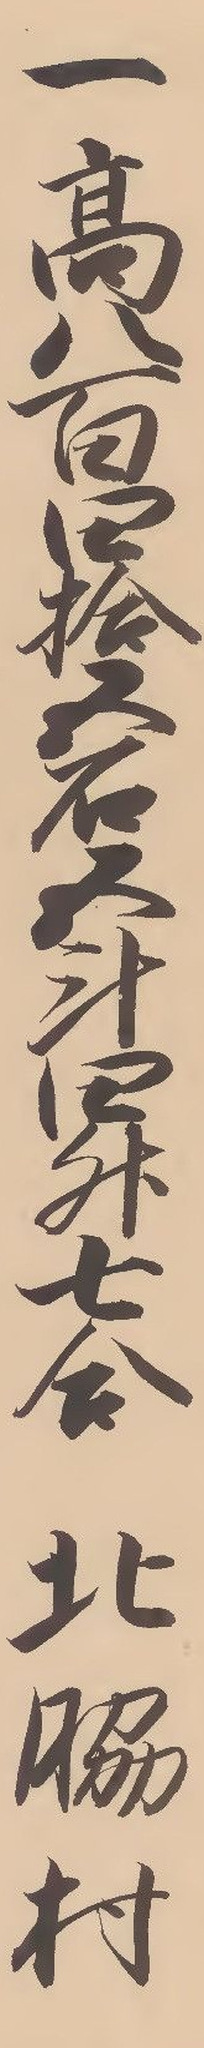一高八百四拾五石五斗四升七合北脇村
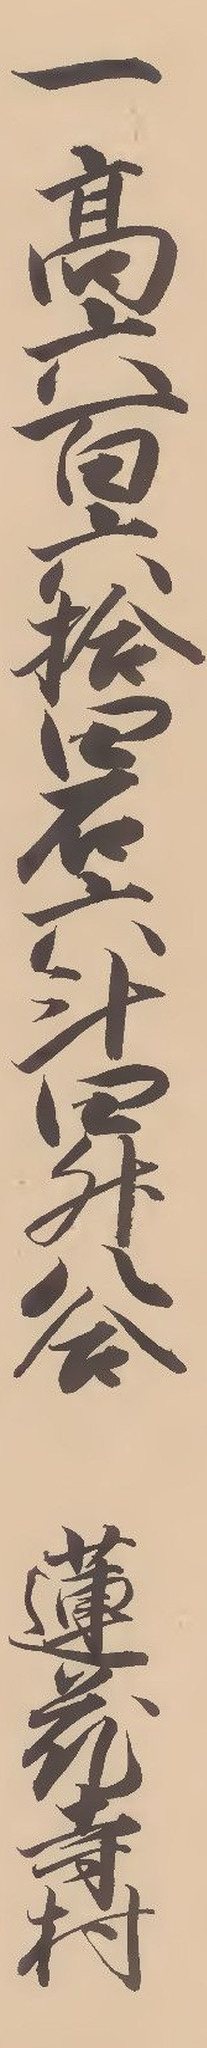一高六百六拾四石六斗四升八合蓮花寺村
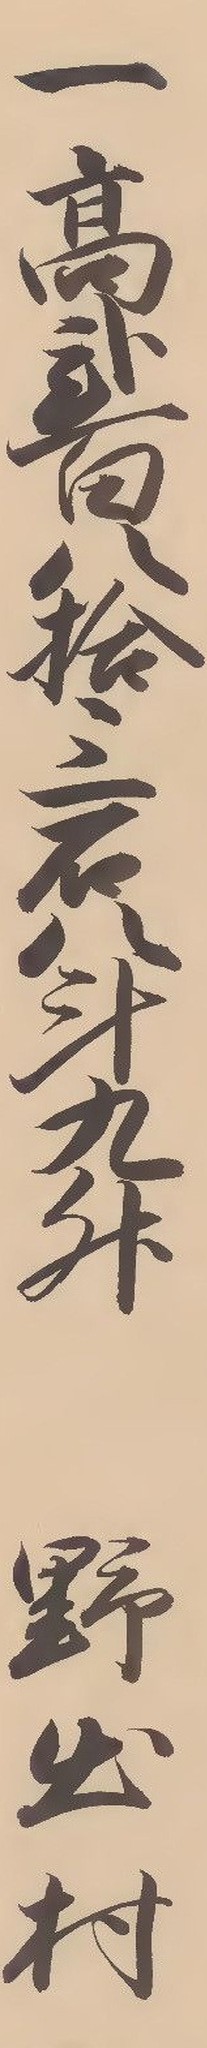一高弐百八拾三石八斗九升野出村
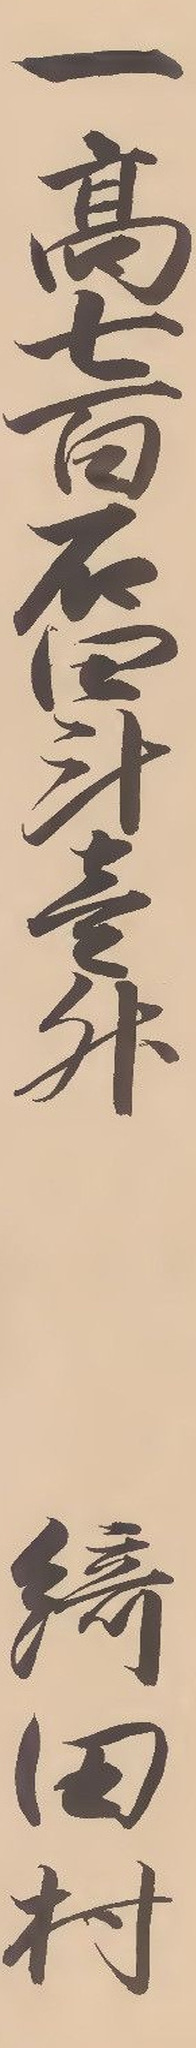一高七百石四斗壱升綺田村
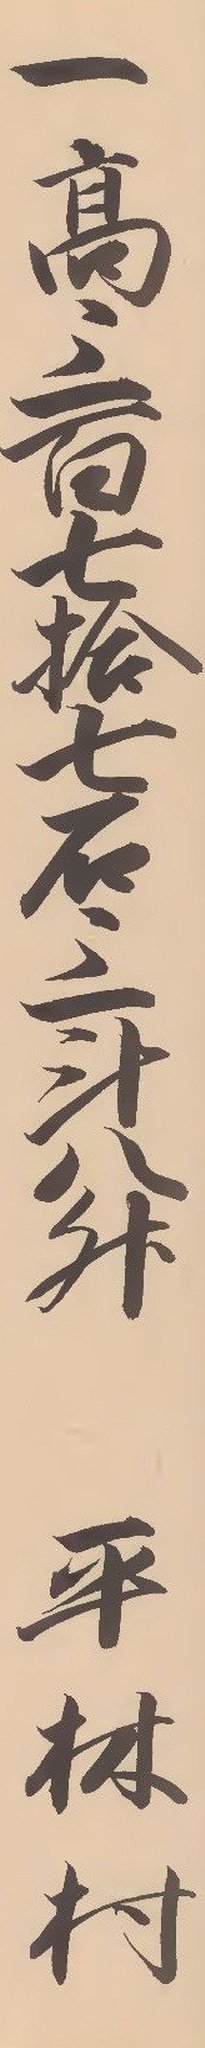一高三百七拾七石三斗八升平林村
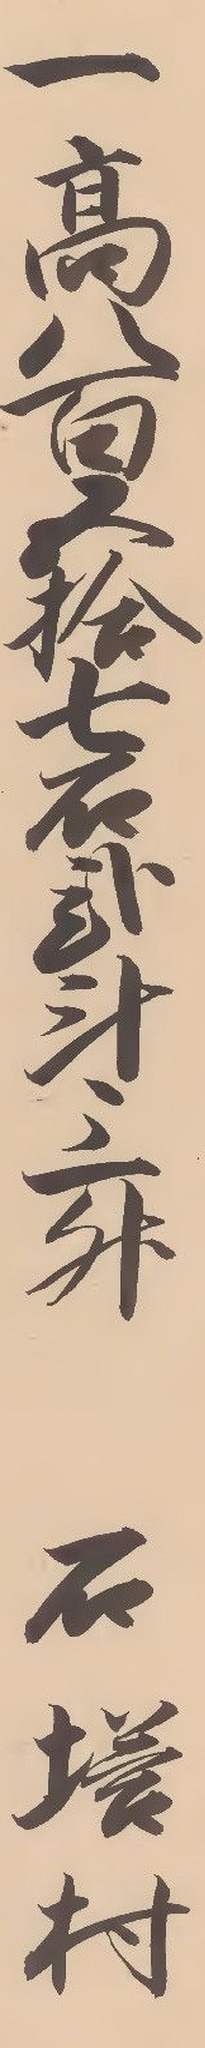一高八百五拾七石弐斗三升石塔村
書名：近江国郷帳
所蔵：国立公文書館 National Archives of Japan
